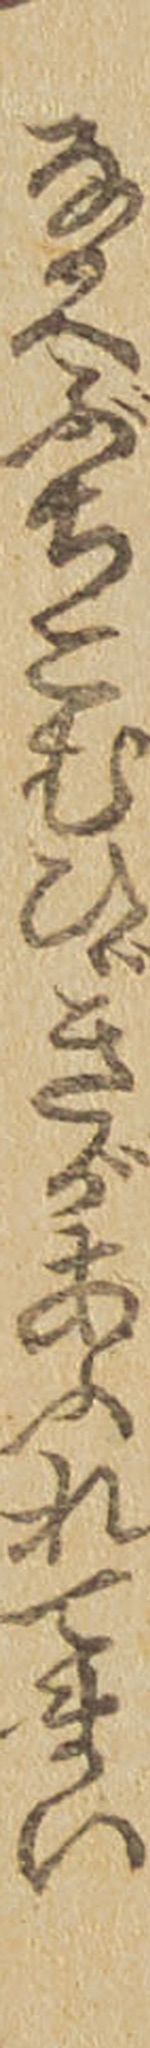なかへぶちこむひゞきがあふれてまい
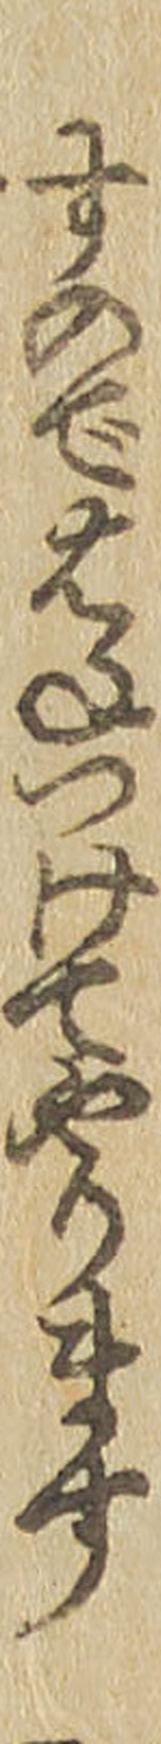すのではねつけてやります
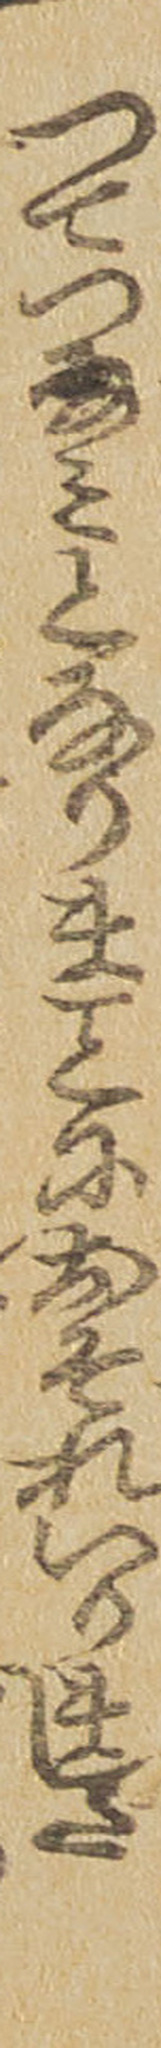つてつなみとなりまことにおそれいりました
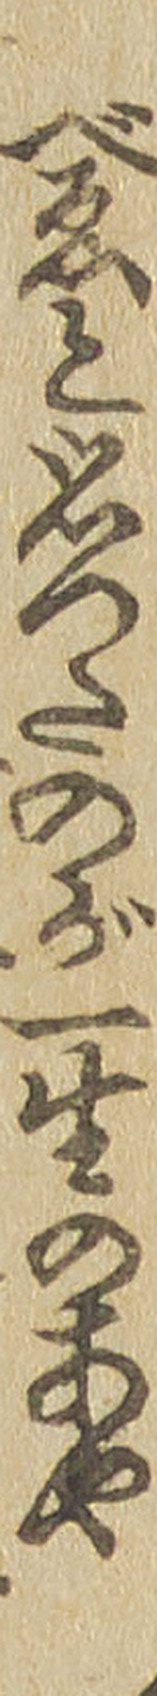べゑと思つたのが一生のあや
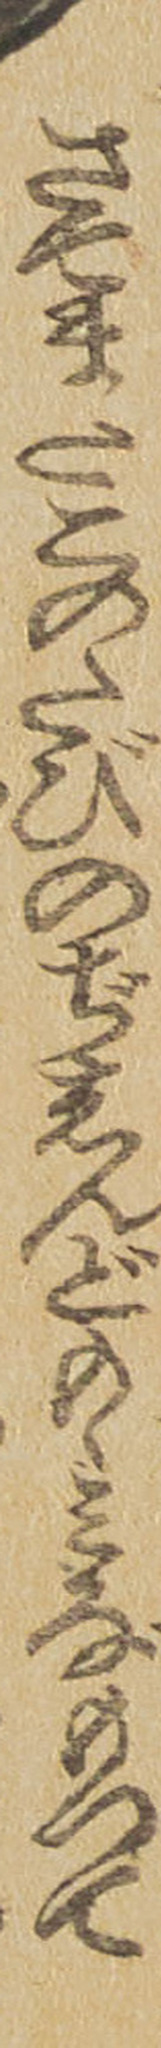さてまたこのたびのぢしんどももみなもつて
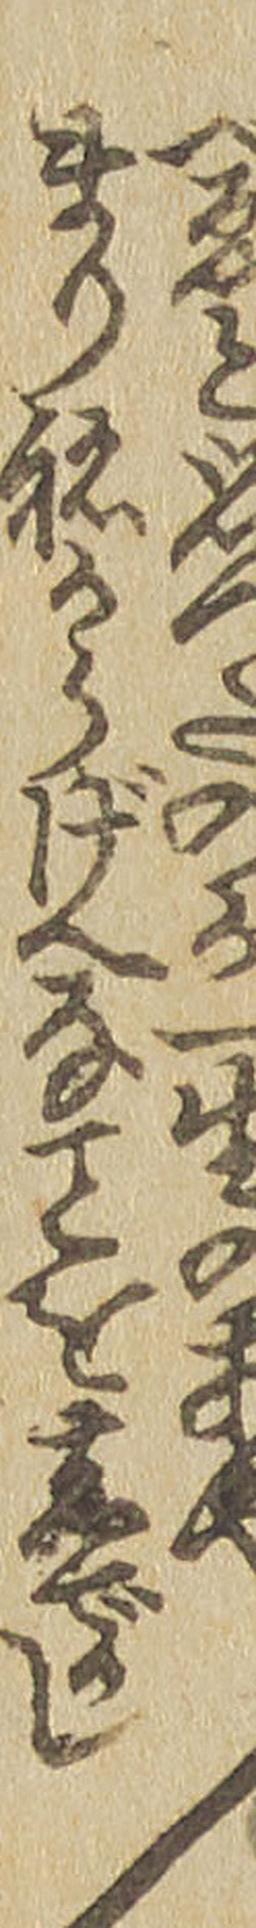まりねかうげへなことをしでかし
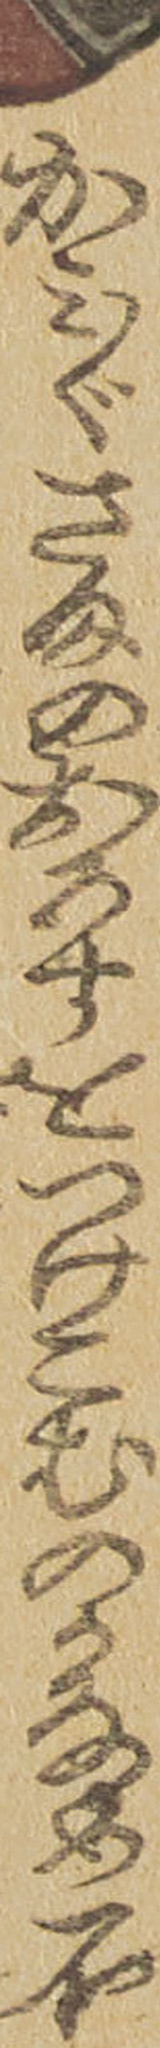かみ〴〵さまのおるすをつけこむのかなめ石
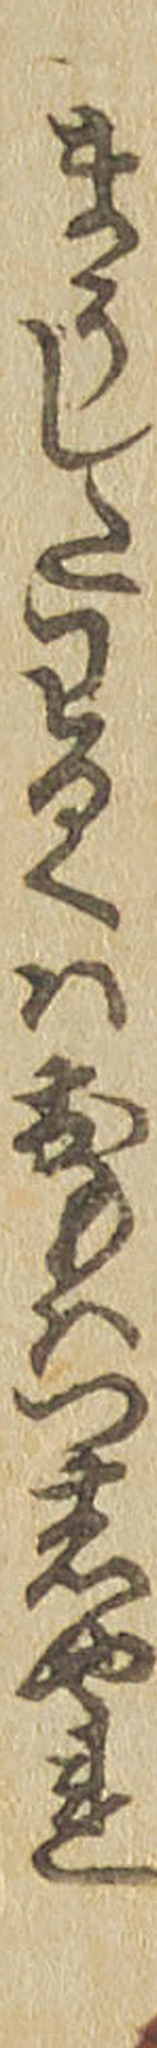まうしたわるくはおもはつしやれ
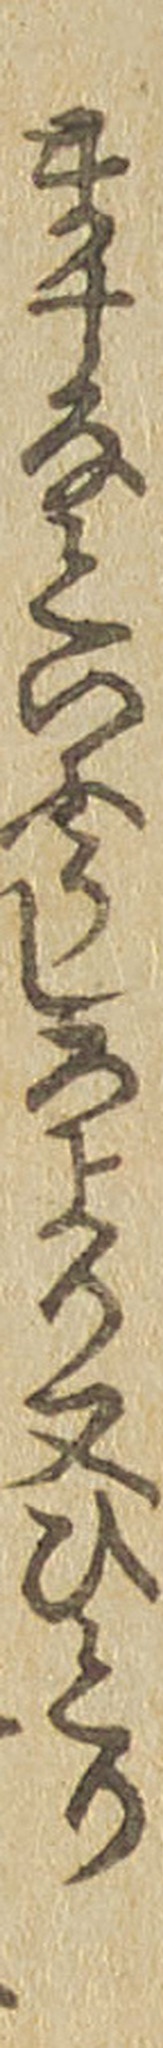ますなといふうしろより又ひとり
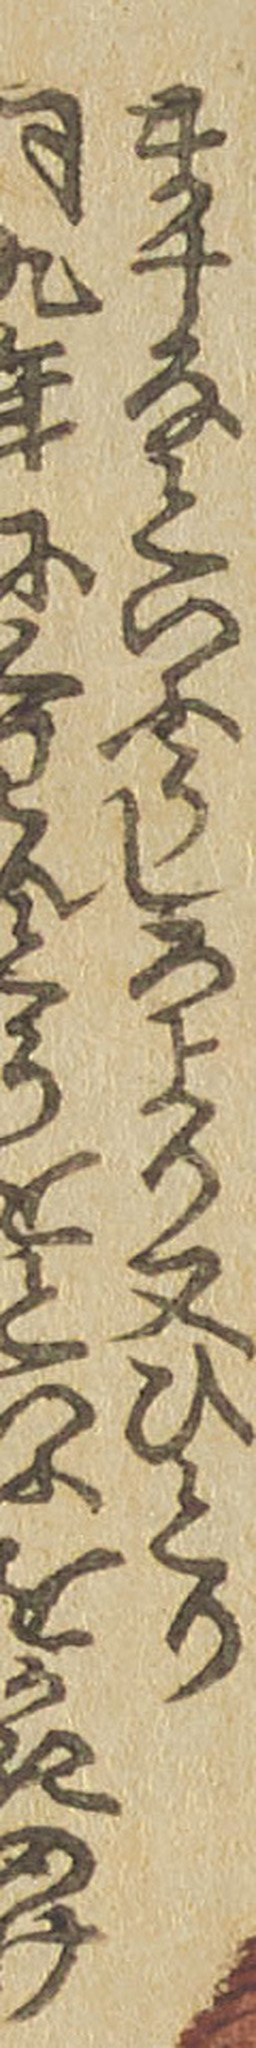同九年にくわんとうをといふをかきのけ
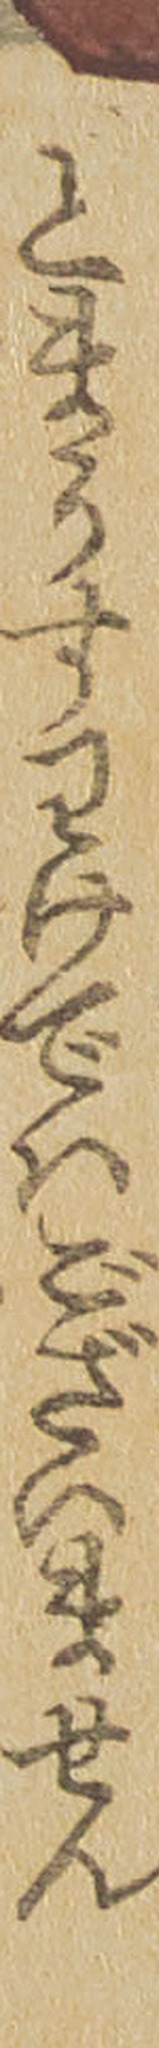とまうすわけではございません
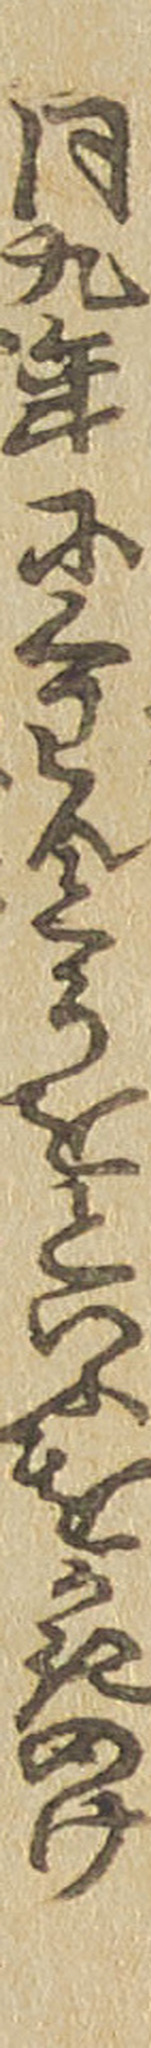同九年にくわんとうをといふをかきのけ
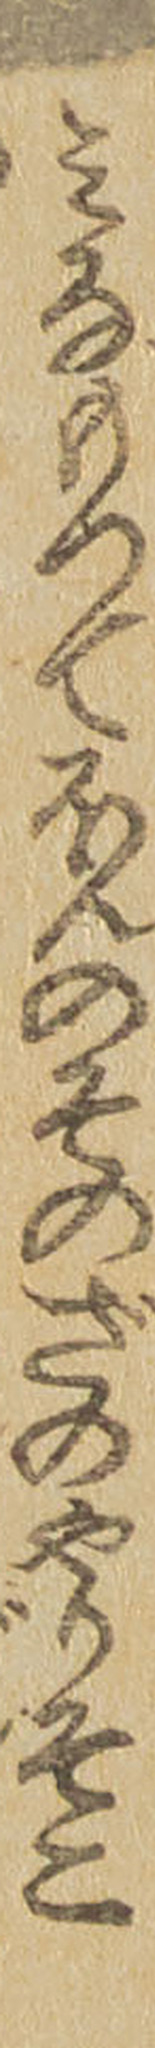みなもつてほんのそのざのやりそこ
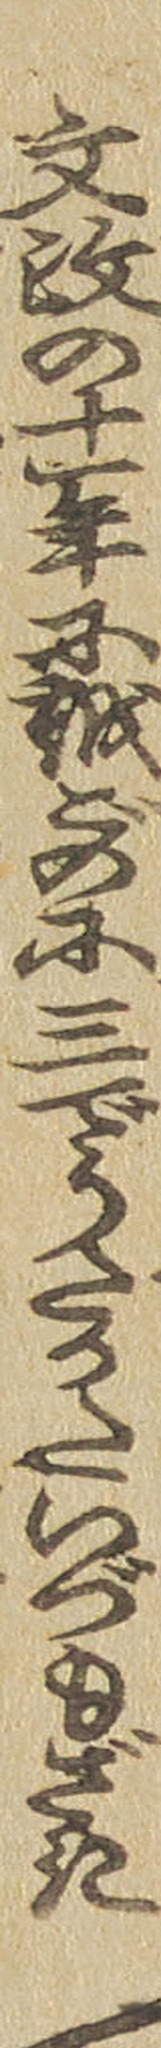文政の十一年に越ごのに三でうたかたいづもざき
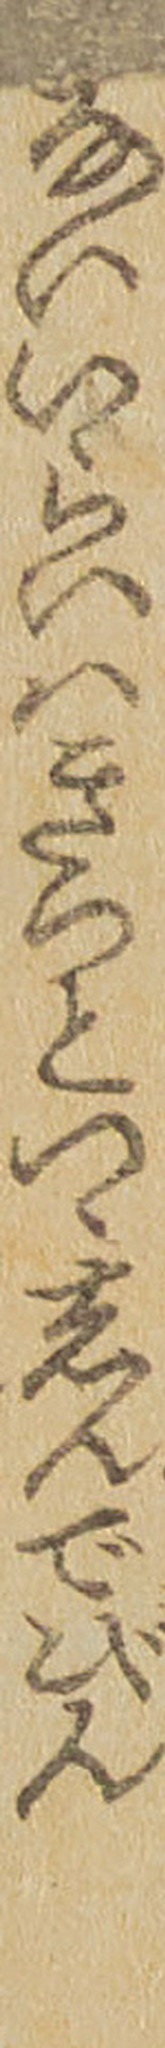ないいらいはきつとつゝしんでびん
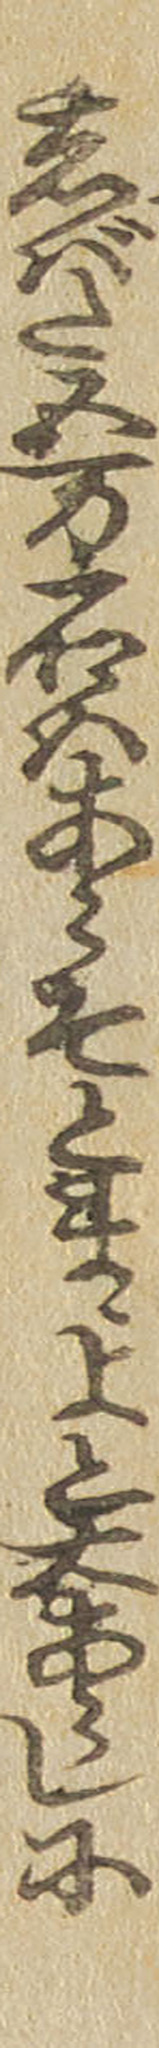しばた五万石はあらそとまゝよと大あらしに
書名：地震太平記
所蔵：東京大学総合図書館 General Library in the University of Tokyo, JAPAN
